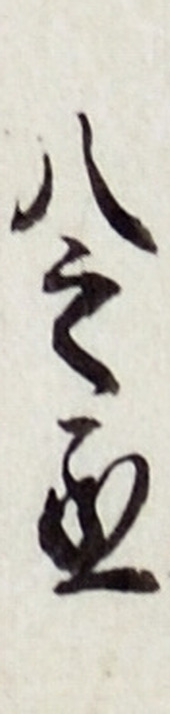八之丞
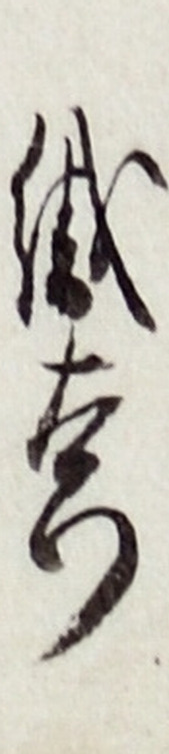織右衛門
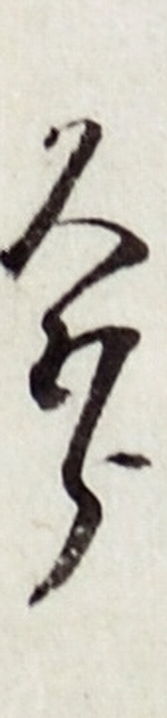久五郎

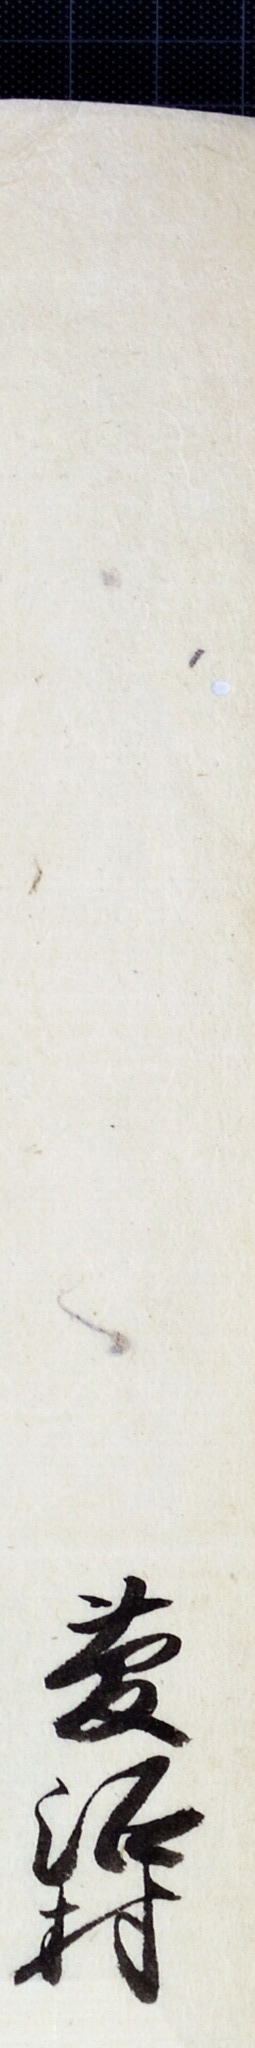菅沼村
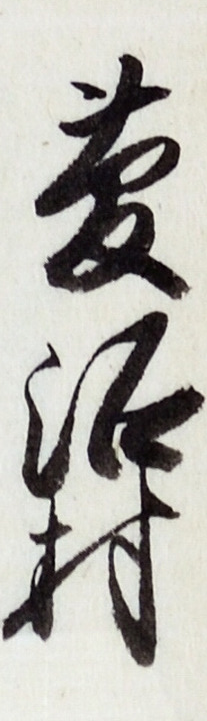菅沼村
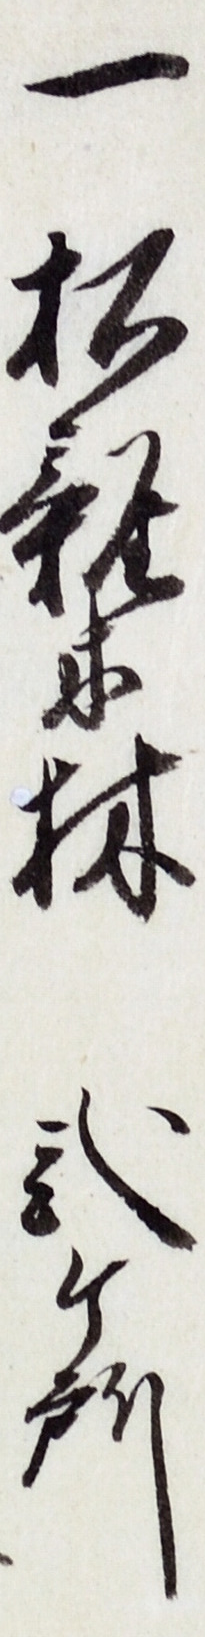一松雑木林弐ヶ所
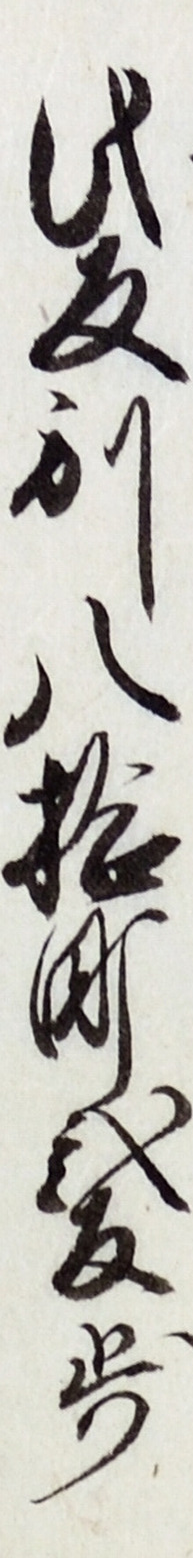此反別八拾町弐反歩
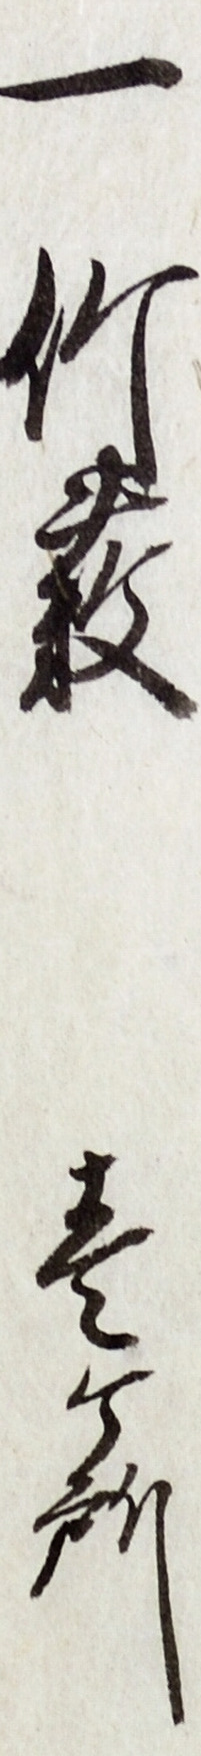一竹藪壱ヶ所
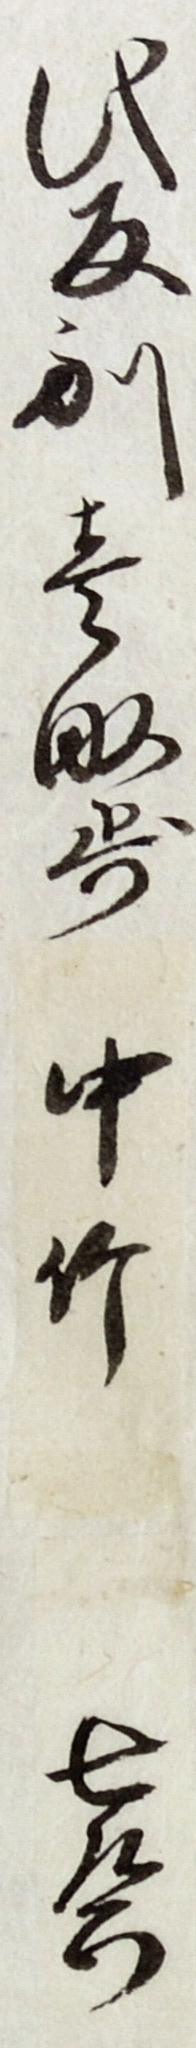此反別壱畝歩仲竹七左衛門

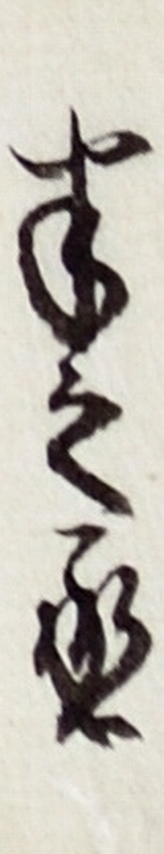半之丞
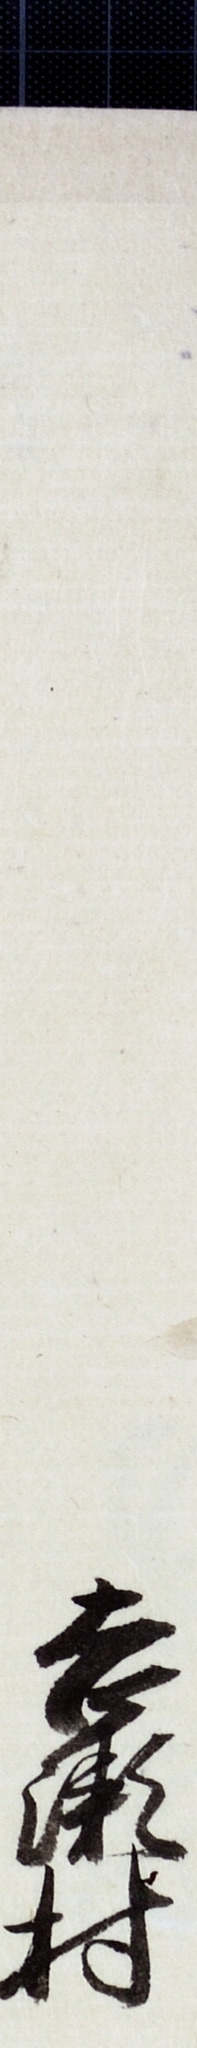吉瀬村
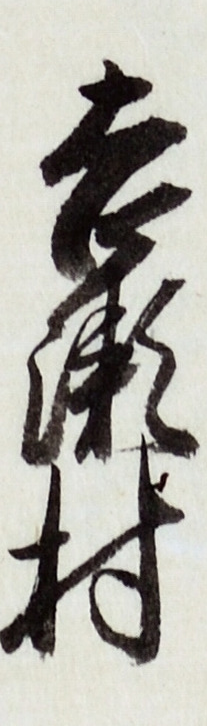吉瀬村
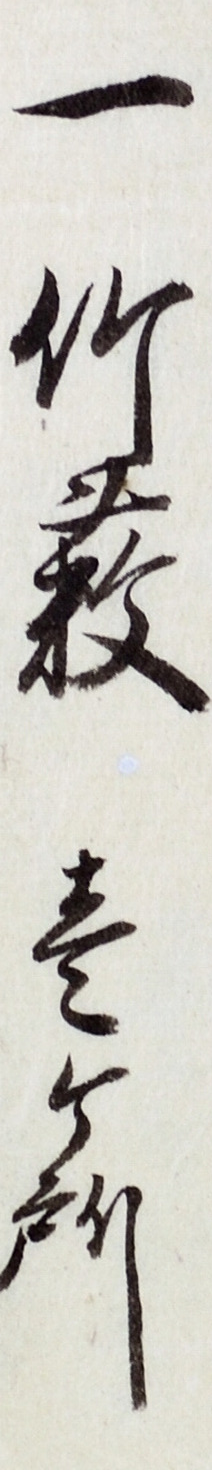一竹藪壱ケ所

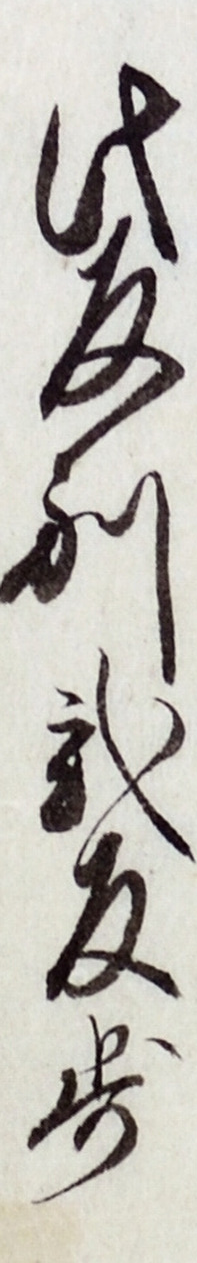此反別弐反歩
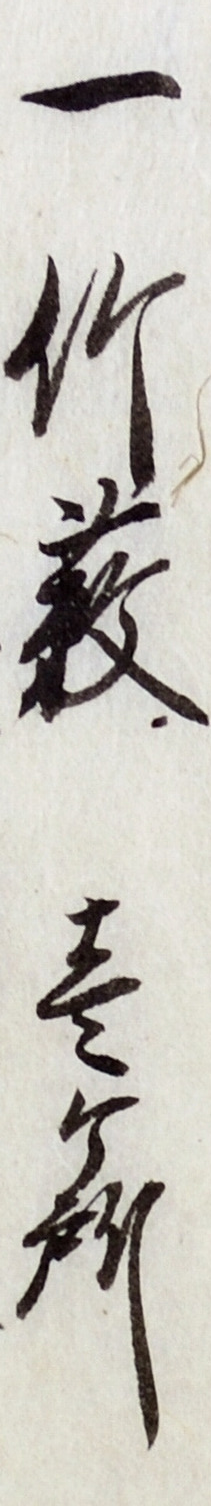一竹藪壱ケ所

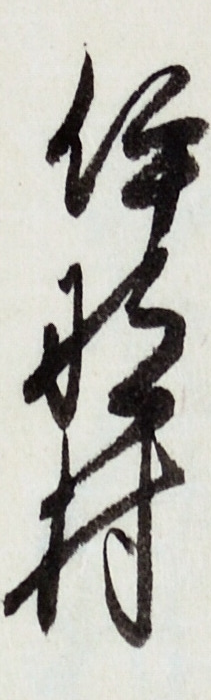伊那村
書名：御領分中御林御藪附帳
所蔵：伊那市立高遠町図書館・合同会社AMANE
